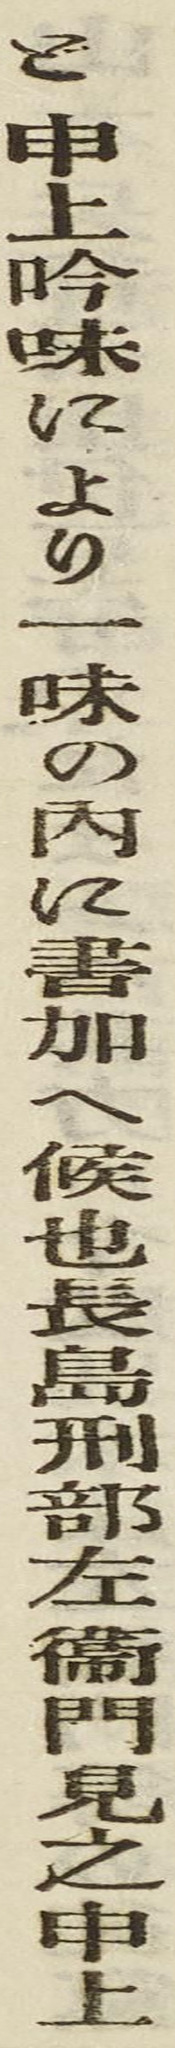と申上吟味により一味の内に書加へ候也長島刑部左衞門見之申上
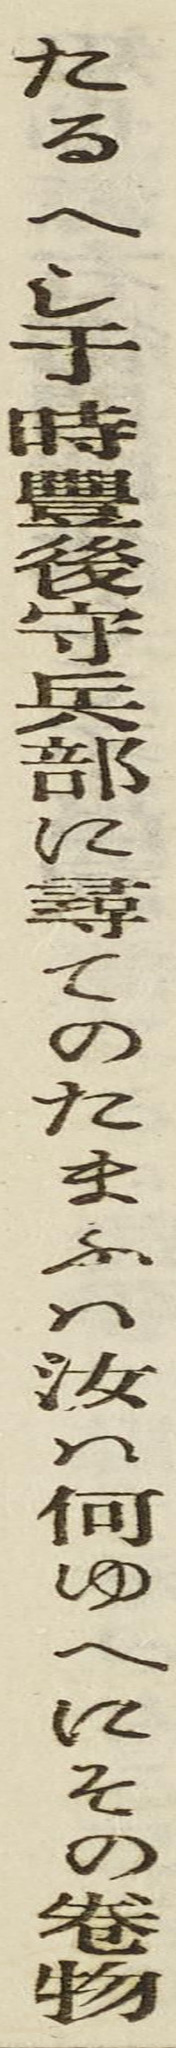たるへし于時豊後守兵部に尋てのたまふは汝は何ゆへにその巻物
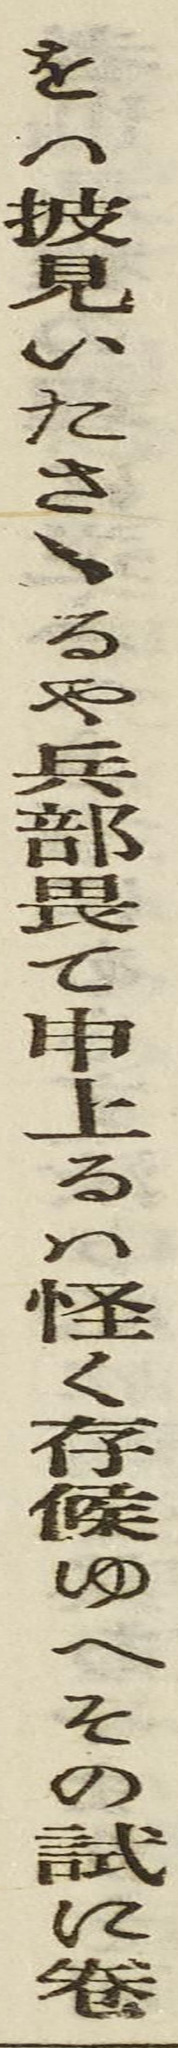をは披見いたさゝるや兵部畏て申上るは怪く存候ゆへその試に巻
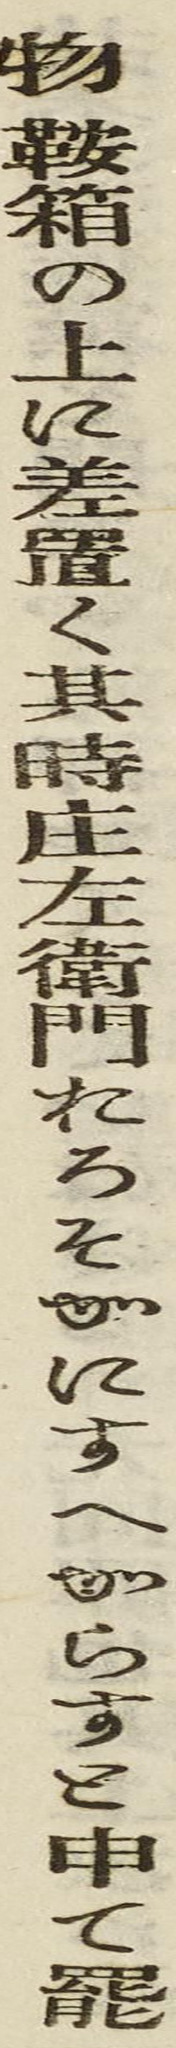物鞍箱の上に差置く其時庄左衛門おろそかにすへからすと申て罷
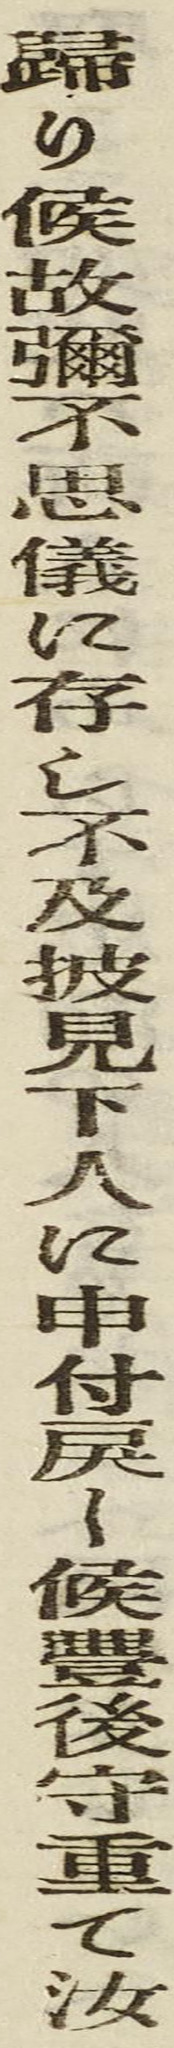帰り候故弥不思儀に存し不及披見下人に申付戻し候豊後守重て汝
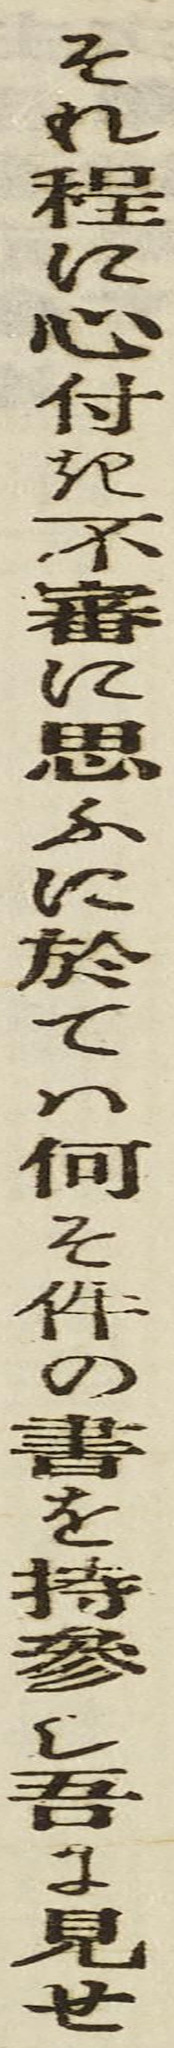それ程に心付を不審に思ふに於ては何そ件の書を持参し吾に見せ
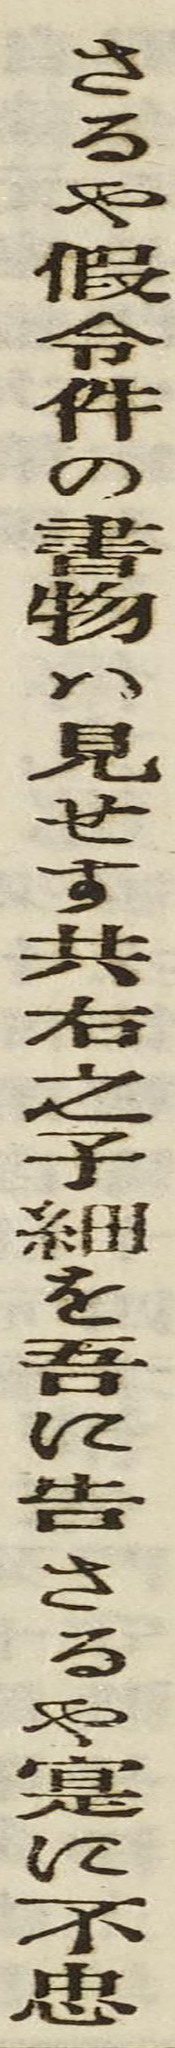さるや仮令件の書物は見せす共右之子細を吾に告さるや寔に不忠
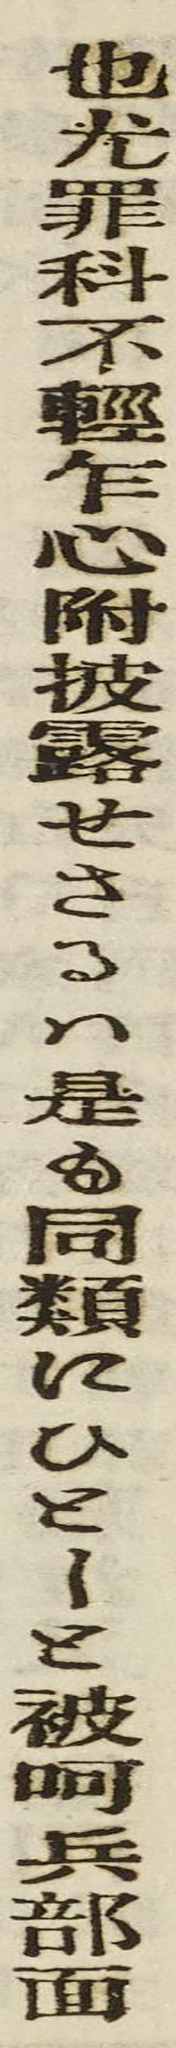也尤罪科不軽乍心附披露せさるは是も同類にひとしと被呵兵部面
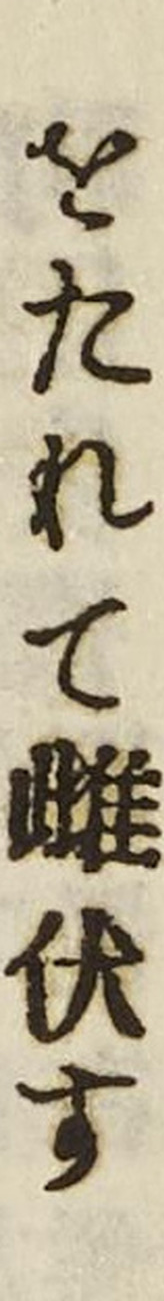をたれて雌伏す
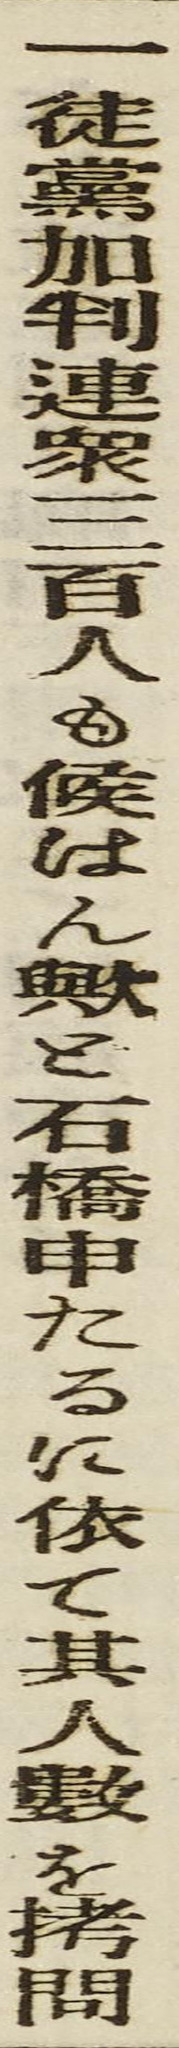一徒党加判連衆三百人も候はん歟と石橋申たるに依て其人数を拷問
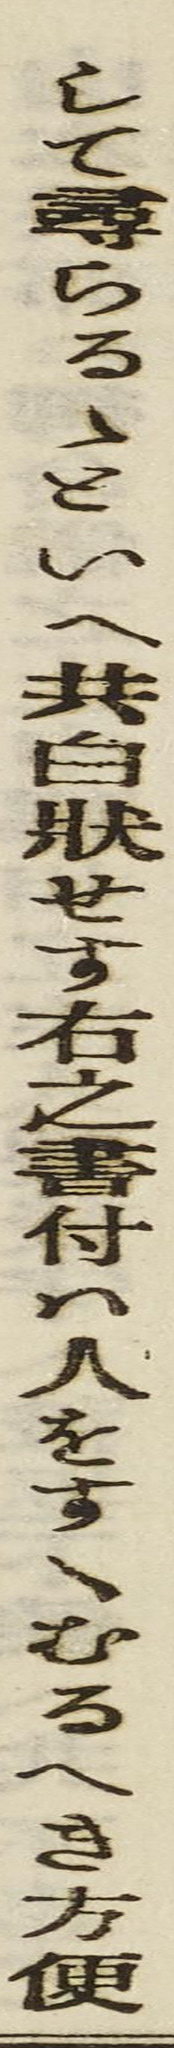して尋らるゝといへ共白状せす右之書付は人をすゝむるへき方便
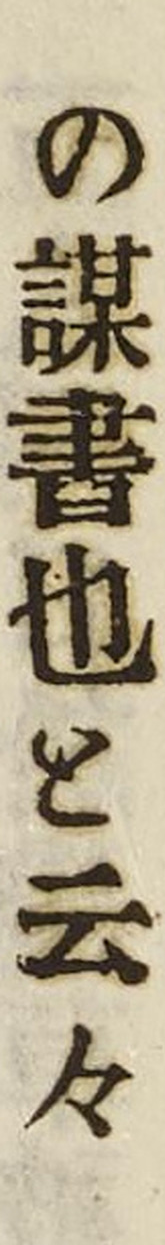の謀書也と云々
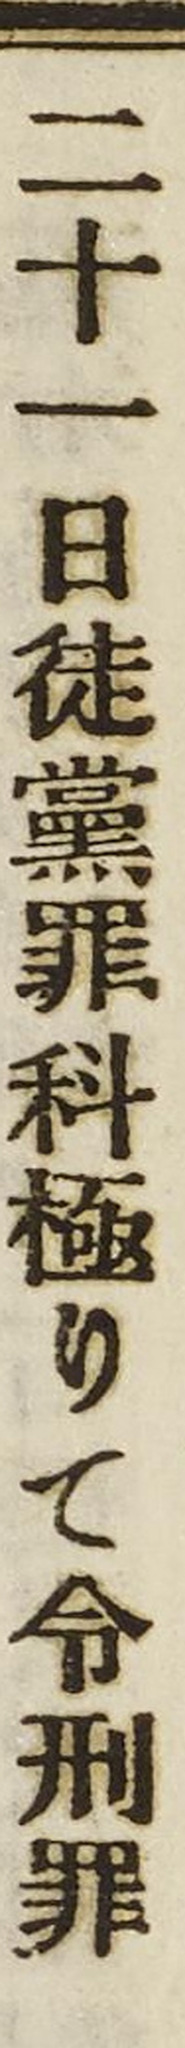二十一日徒党罪科極りて令刑罪

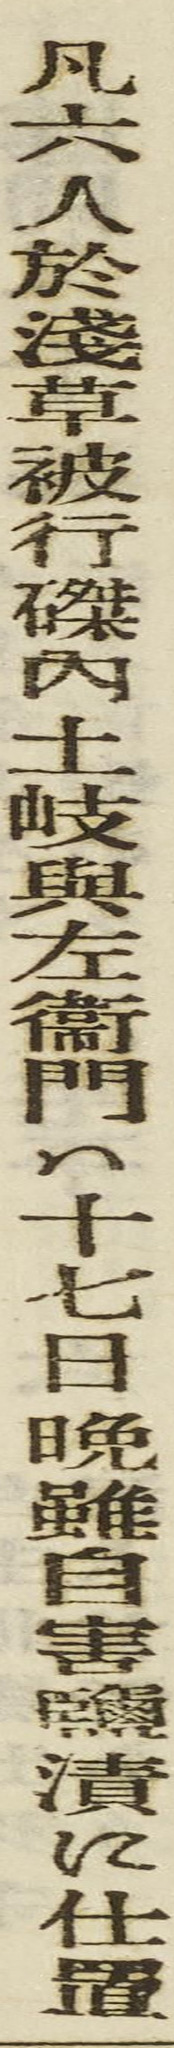凡六人於浅草被行磔内土岐与左衞門は十七日晩雖自害塩漬に仕置
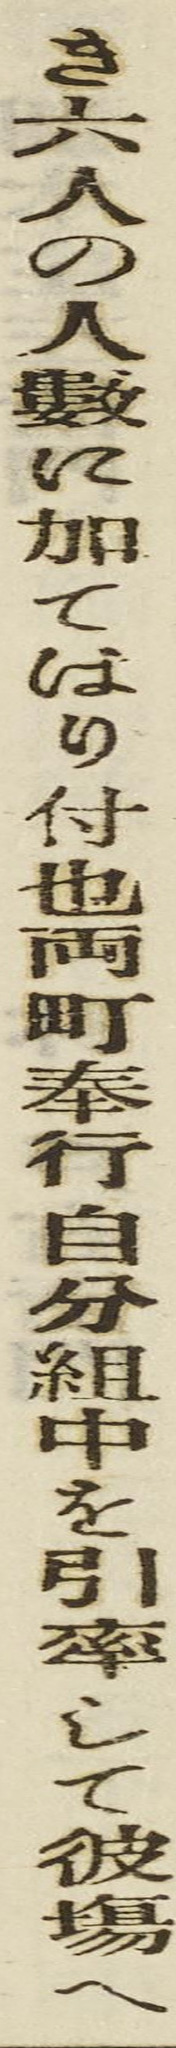き六人の人数に加てはり付也両町奉行自分組中を引率して彼場へ
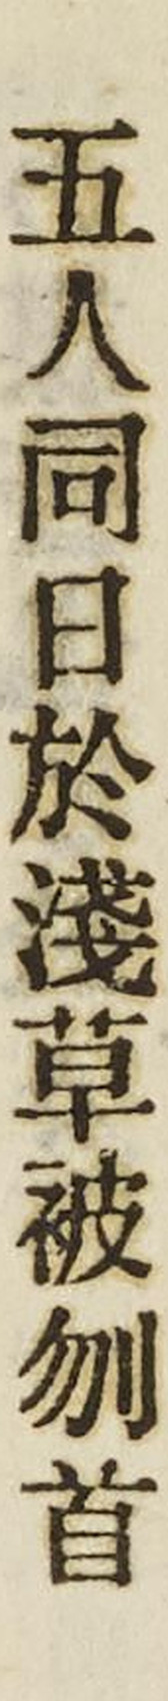五人同日於浅草被刎首
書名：史籍集覽　朝鮮陣古文・細井廣澤記・颶風紀事・天明七年將軍宣下次第書　全
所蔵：東京大学地震研究所図書室 Earthquake Research Institute Library, The University of Tokyo, JAPAN
